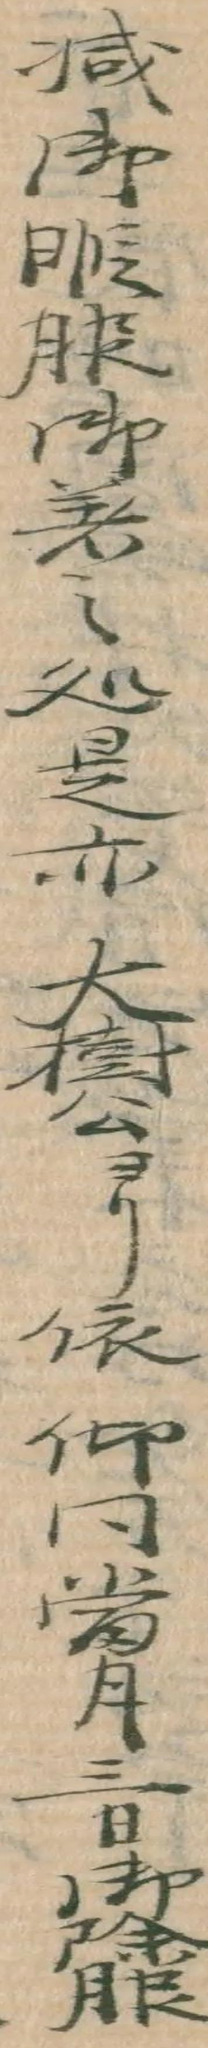減御暇服御着之処是亦大樹公ヨリ依仰同當月三日御除服
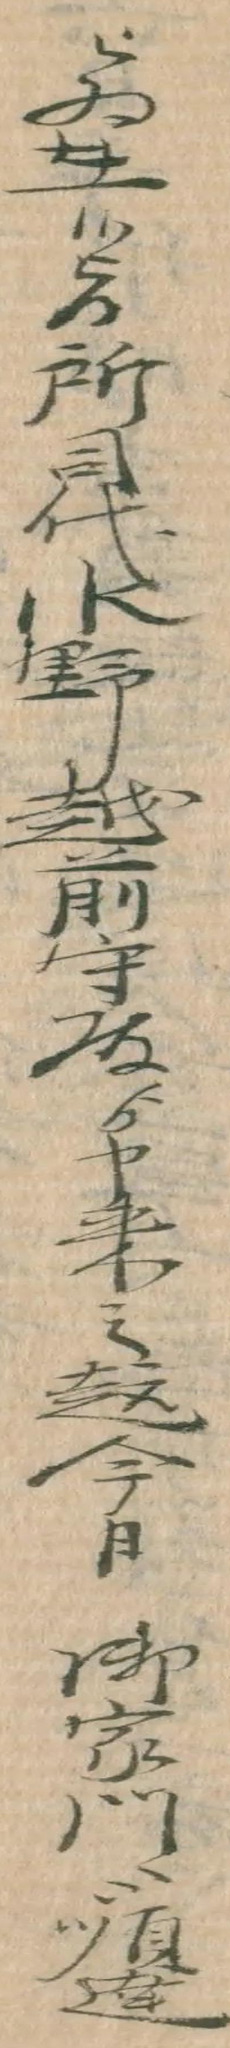被為在候旨所司代水野越前守殿ゟ申来之趣今日御家門へ御順達
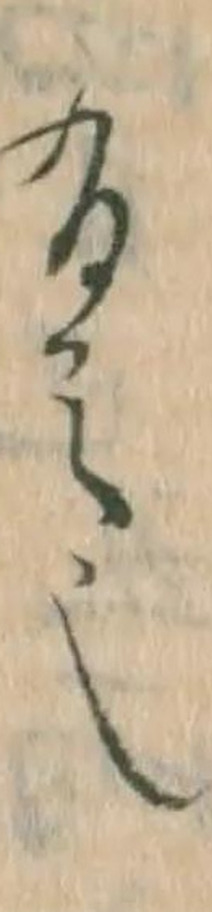有之也
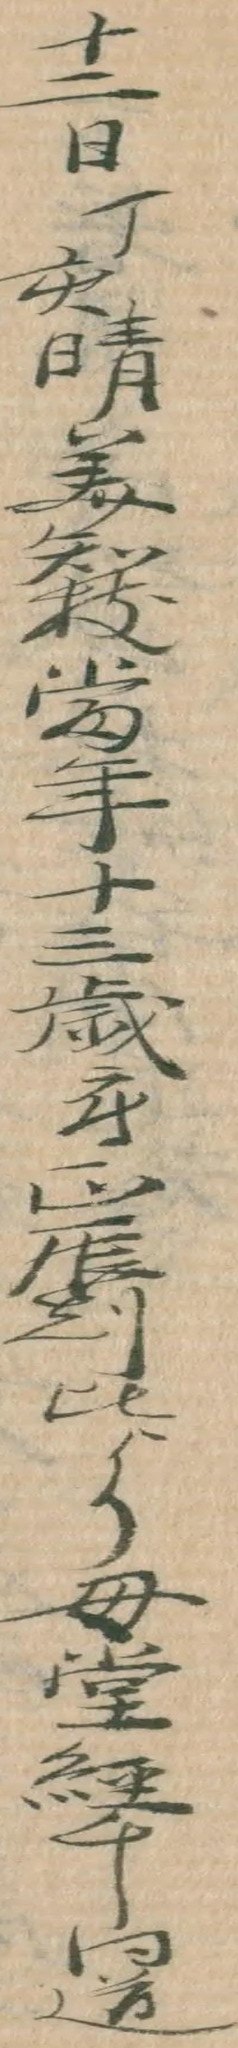十二日丁亥晴美知枝當年十三歳ニ付正辰刻比より母堂経千同道
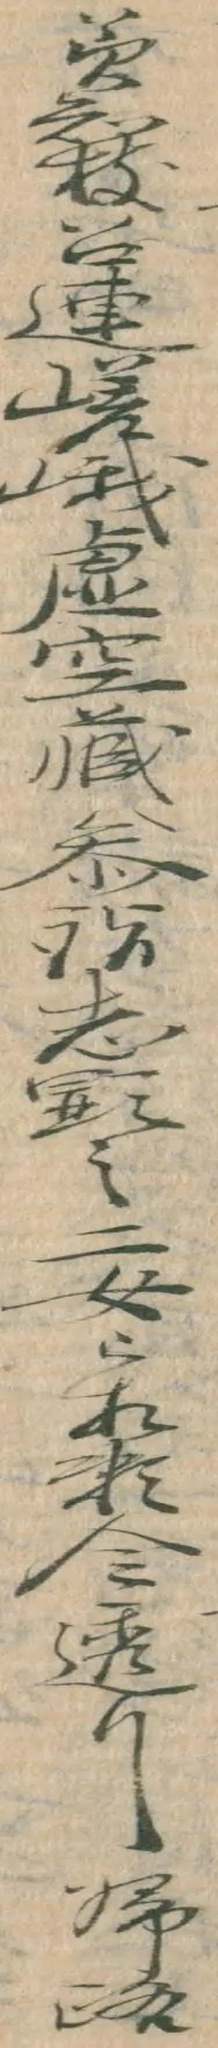美知枝召連嵯峨虚空蔵参詣志顕之二女被相頼令透引帰路
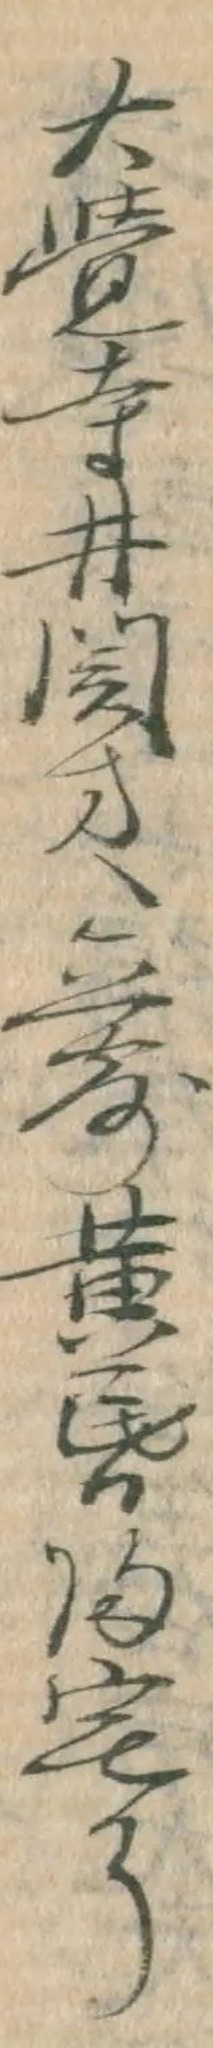大覚寺井関方へ立寄黄昏帰宅了
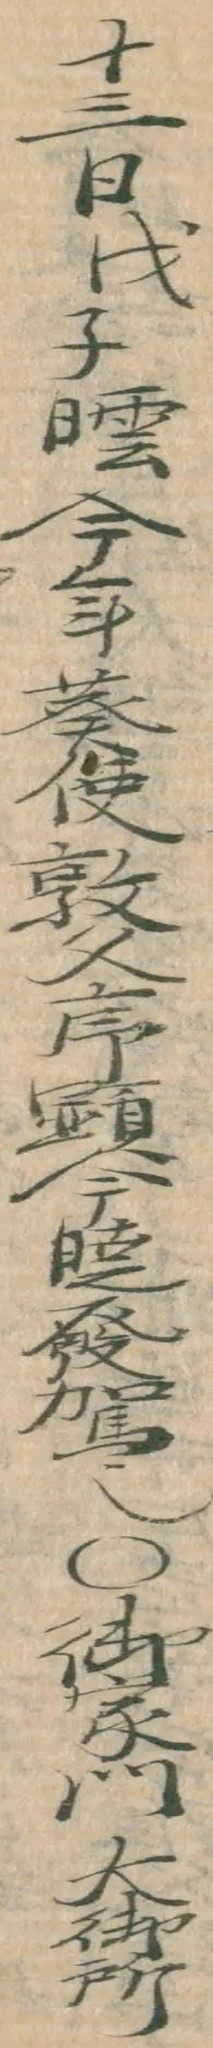十三日戊子曇今年養使敦久序顕今暁発駕也○御家門大御所
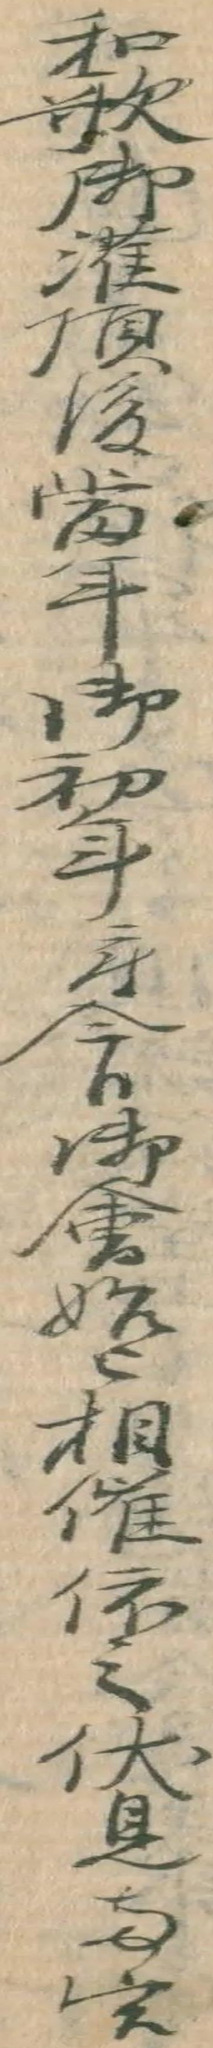和歌御灌頂後當年御初年ニ付今日御會始被相催依之伏見両宮
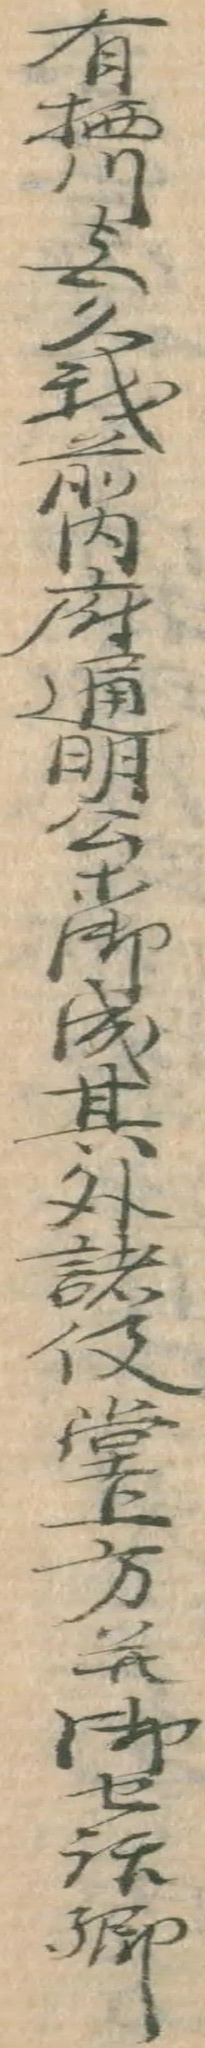有栖川宮久我前内府通明公等御成其外諸役堂上方并御世話卿

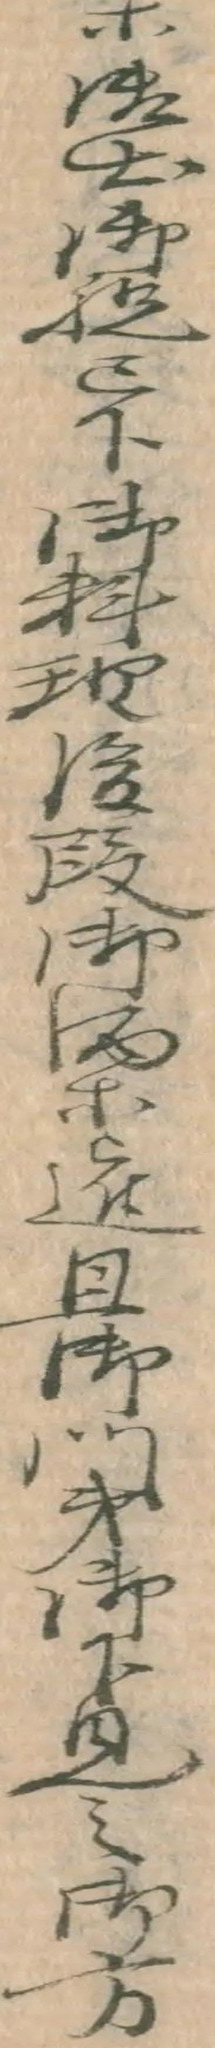等御出御祝已下御料理後段御酒等迄且御門弟御下見之御方
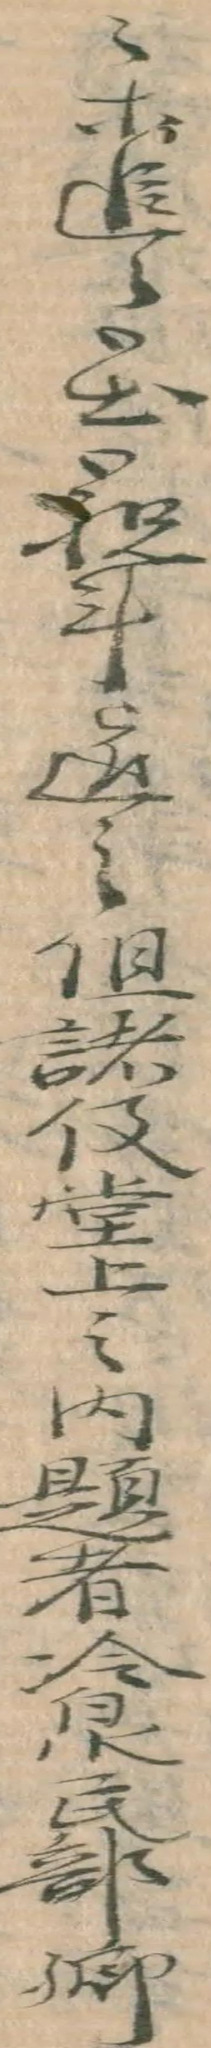々御追々御出御祝斗被返之但諸役堂上之内題者冷泉民部卿
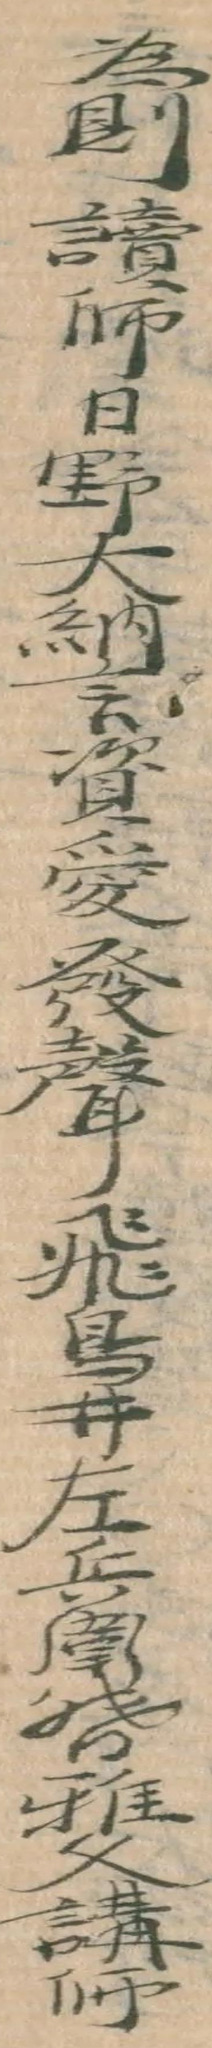為則讀師日野大納言資愛發聲飛鳥井左兵衛督雅久講師
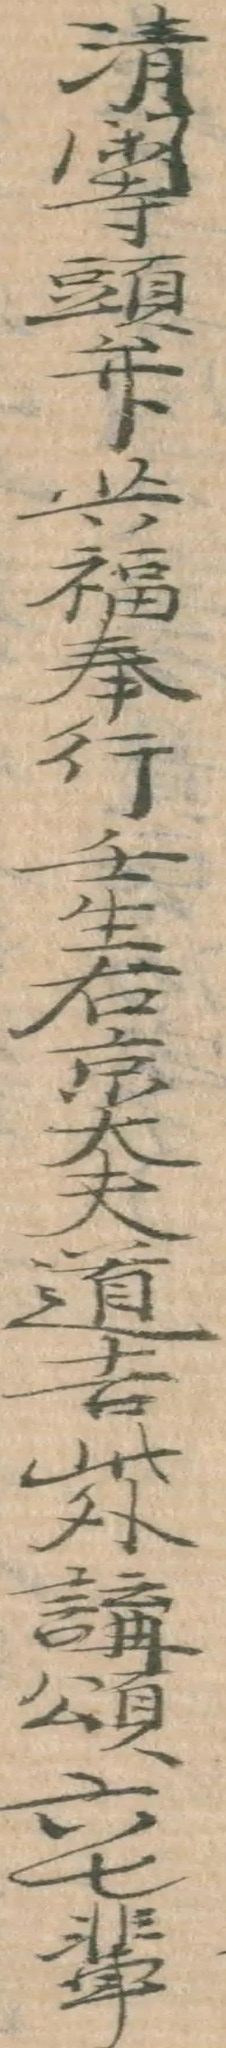清閑寺頭弁共福奉行壬生右京大夫道吉此外講頌六七輩
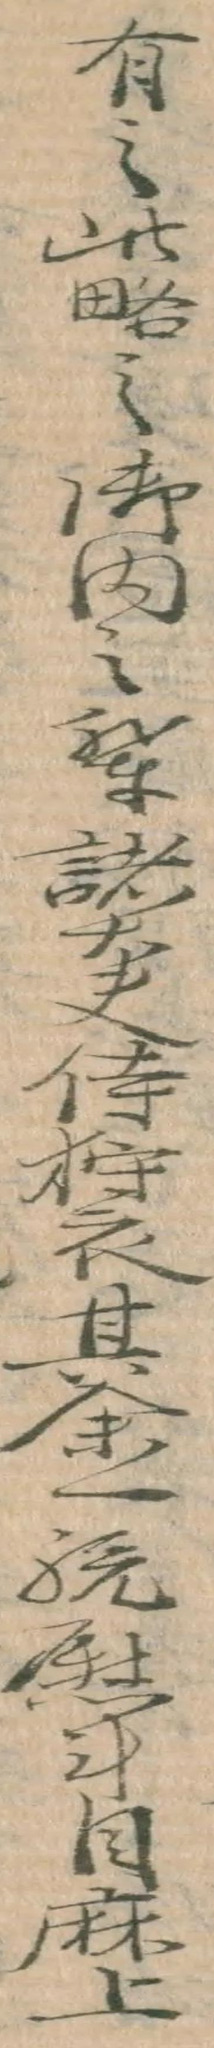有之此略之御内之輩諸大夫侍狩衣其余一統熨斗目麻上
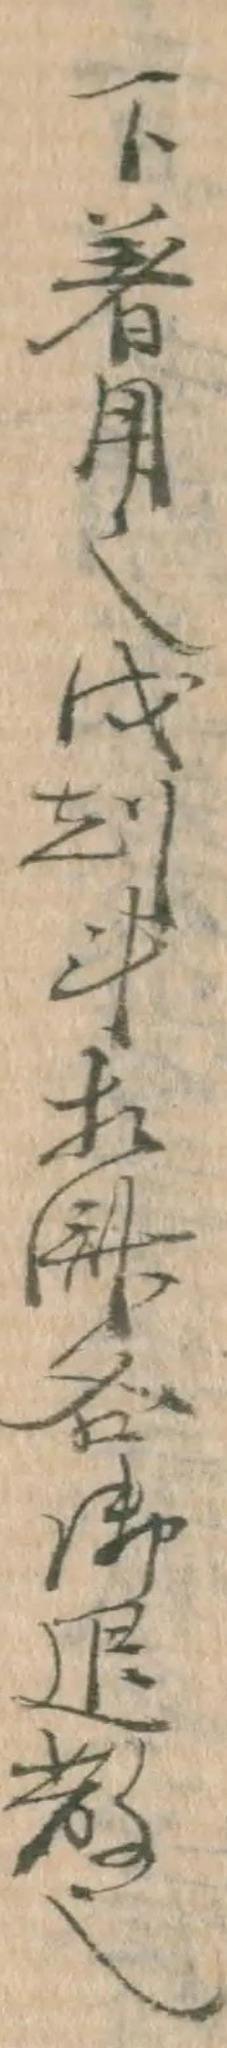下着用也戌刻斗相済各御退散也
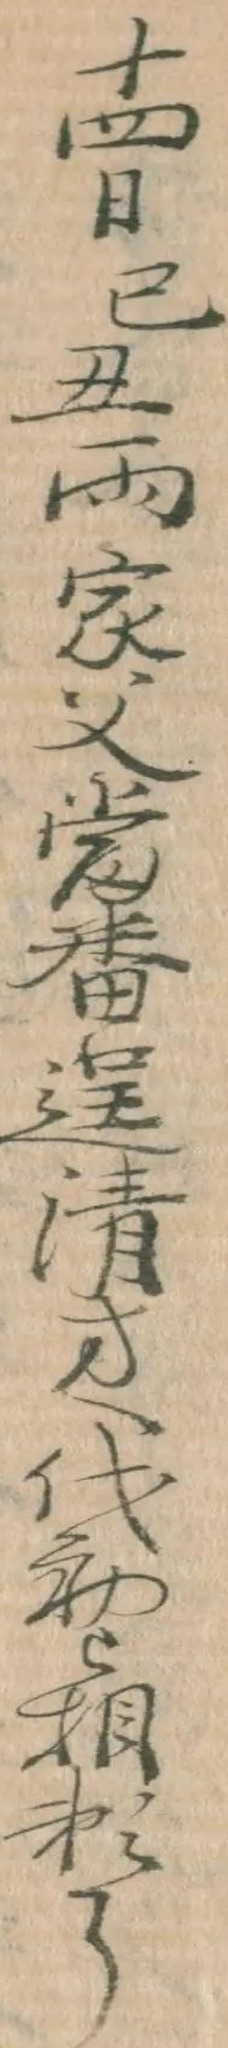十四日己丑雨家父當番逞清方へ代勤被相頼候
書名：賀茂社記録. 第65冊
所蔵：国立国会図書館 National Diet Library, JAPAN
